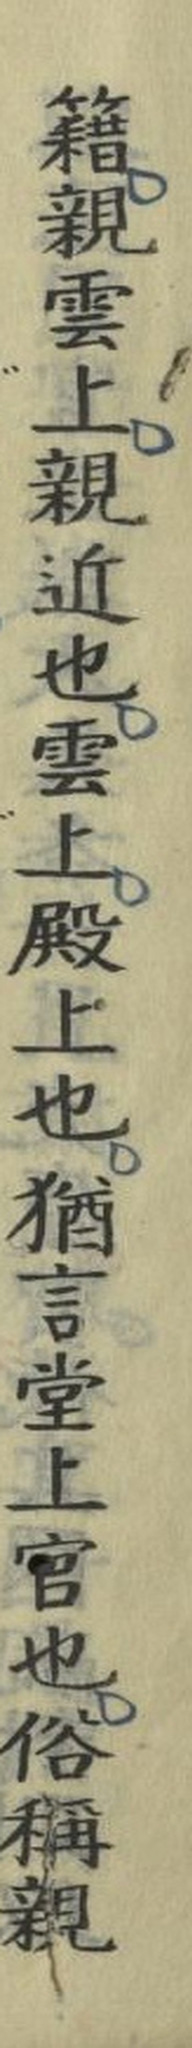籍。親雲上。親近也。雲上。殿上也。猶言堂上官也。俗稱親
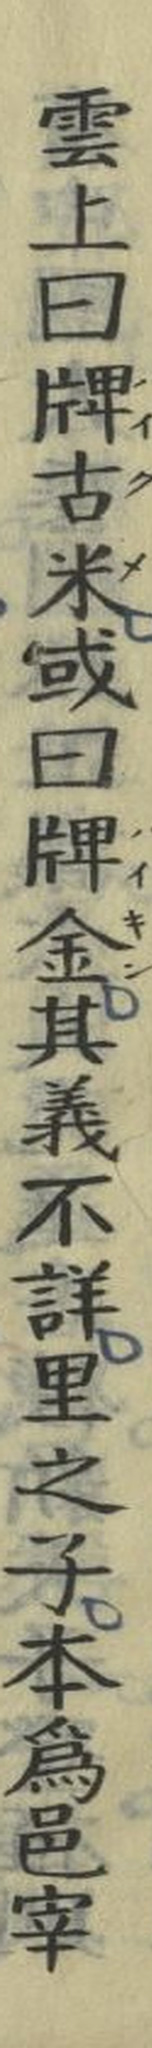雲上曰牌古米。或曰牌金。其義不詳。里之子。本爲邑宰
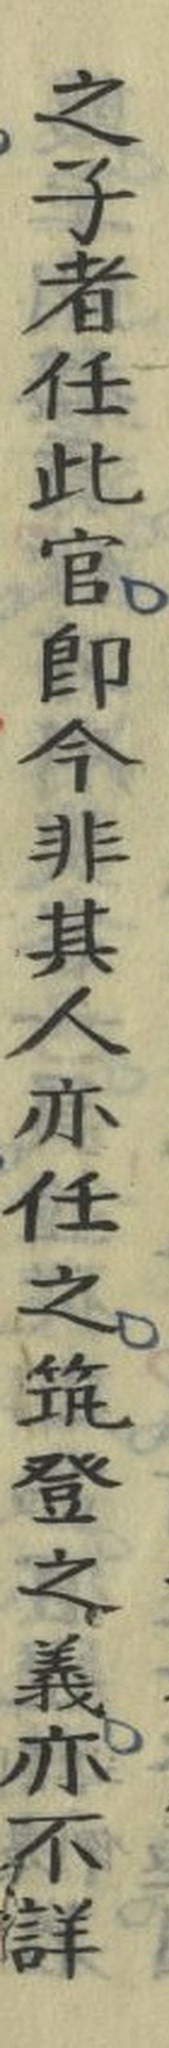之子者任此官。卽今非其人亦任之。筑登之義。亦不詳
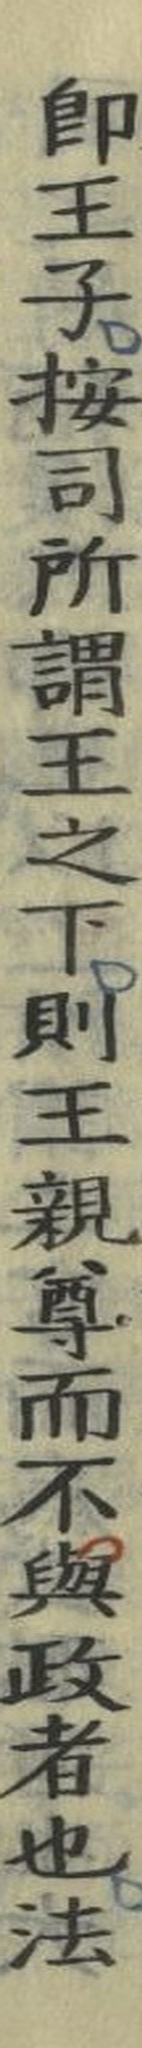卽王子。按司所謂王之下。則王親尊而不與政者也。法
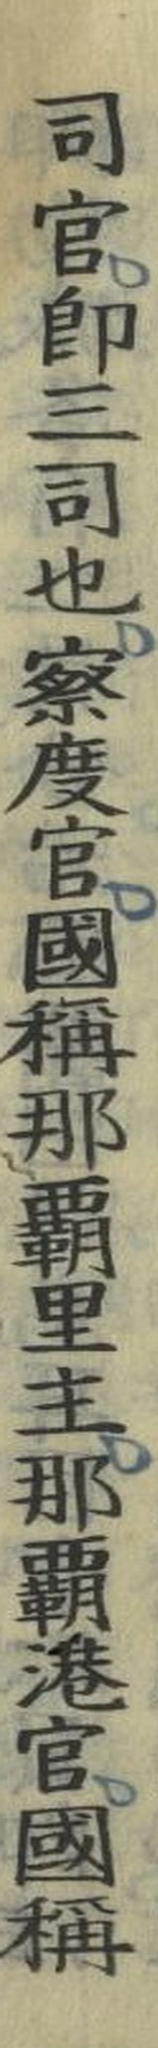司官。卽三司也。察度官。國稱那覇里主。那覇港官。國稱

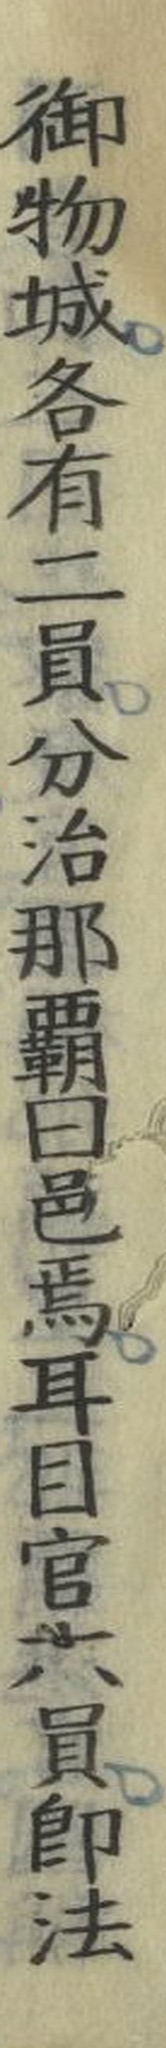御物城。各有二員。分治那覇曰邑焉。耳目官六員。卽法
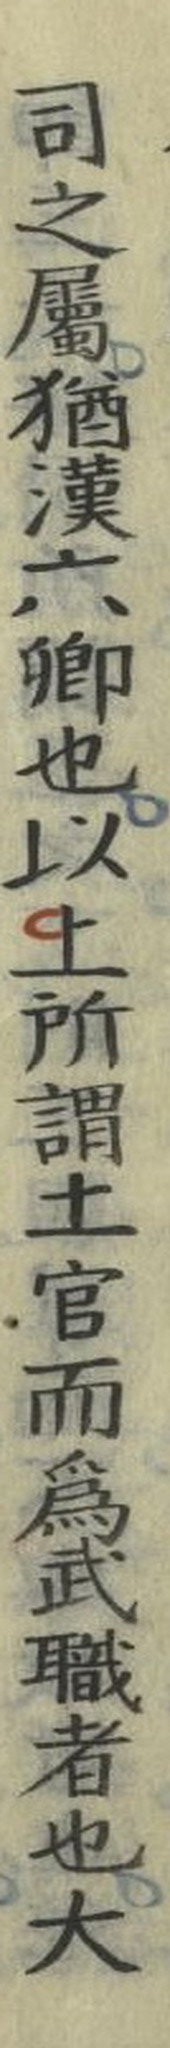司之屬。猶漢六卿也。以上所謂士官而爲武職者也。大
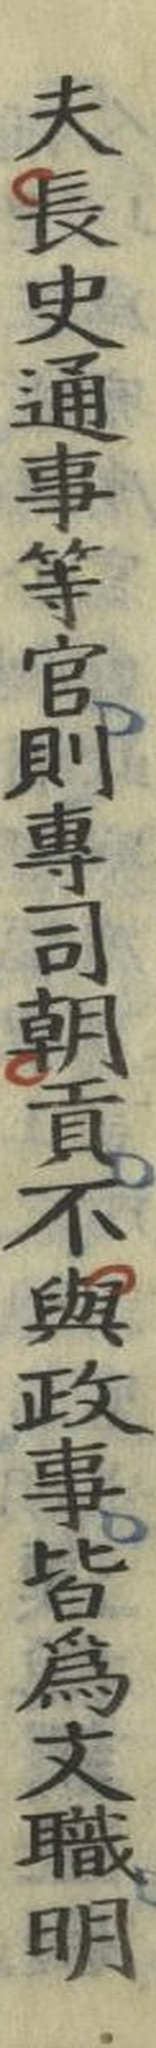夫長史通事等官。則專司朝貢。不與政事。皆爲文職。明
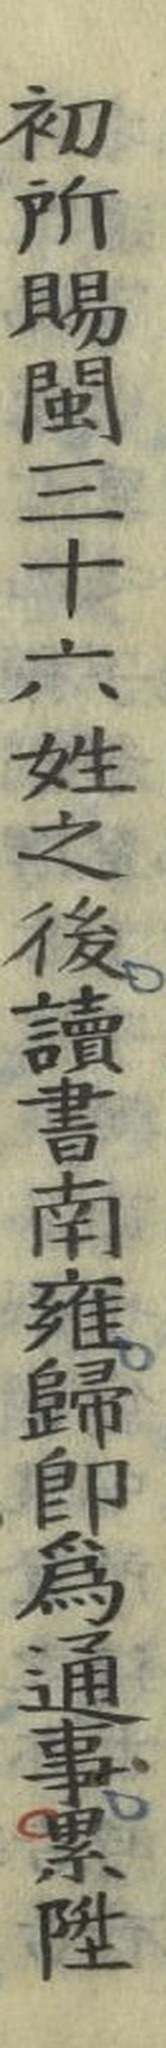初所賜閩三十六姓之後。讀書南雍。歸卽爲通事。累陞
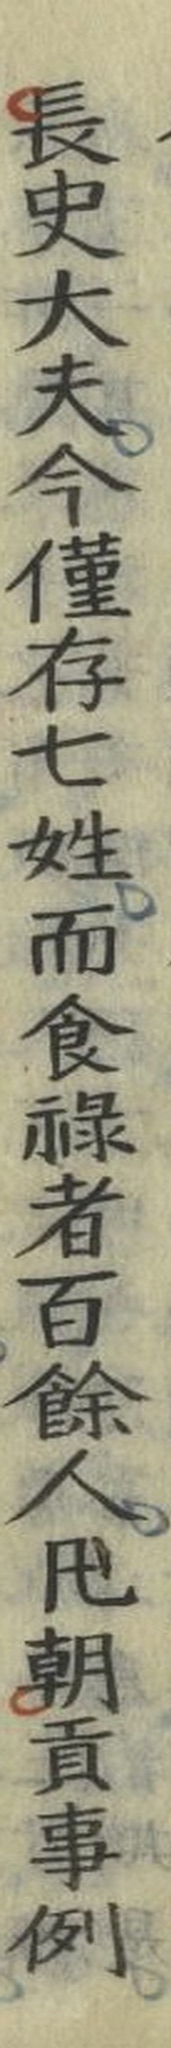長史大夫。今僅存七姓。而食祿者百餘人。凡朝貢事例。
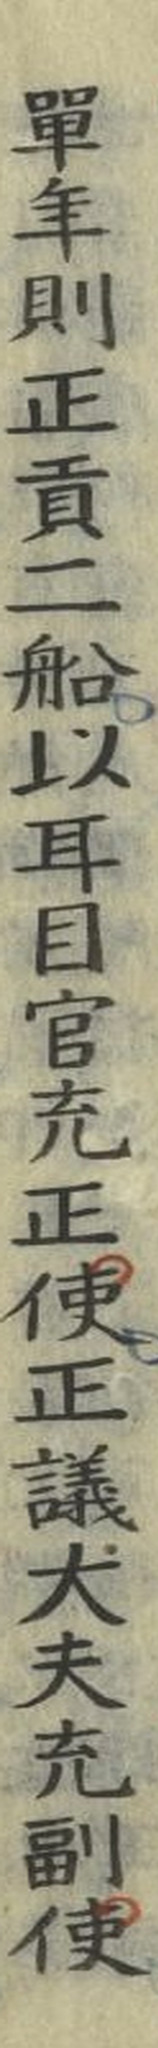單年則正貢二船。以耳目官充正使。正議大夫充副使。
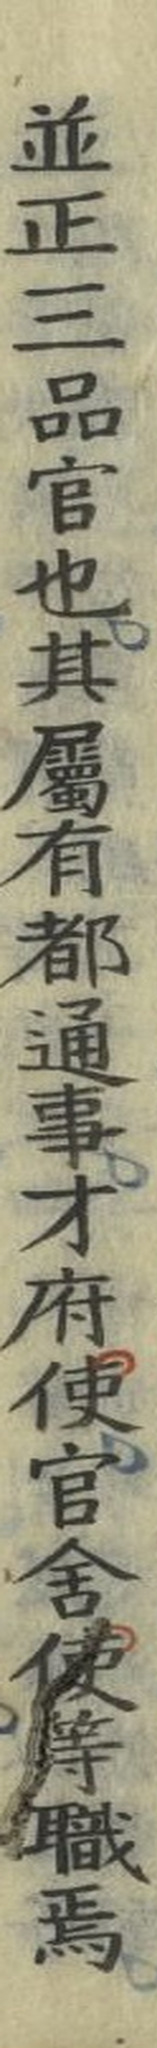並正三品官也。其屬有都通事。才府使。官舎使等職焉。
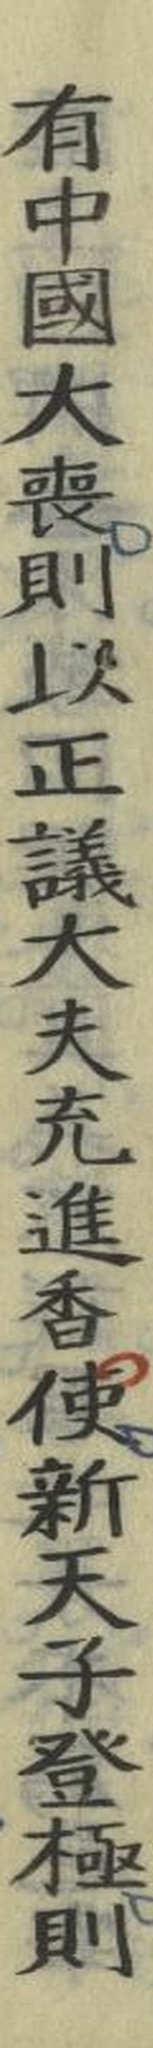有中國大喪。則以正議大夫充進香使。新天子登極。則
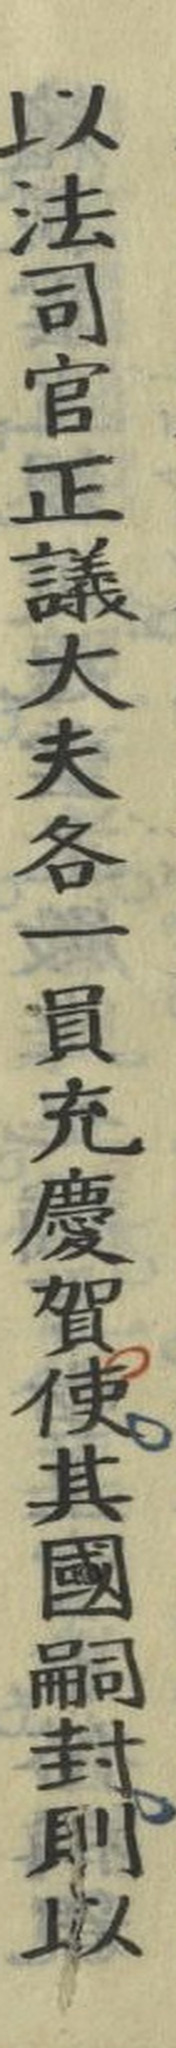以法司官正議大夫各一員充慶賀使。其國嗣封。則以
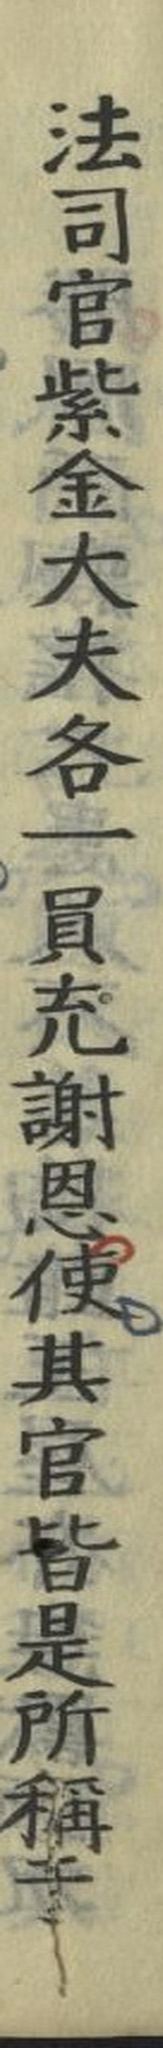法司官紫金大夫各一員充謝恩使。其官皆是所稱于
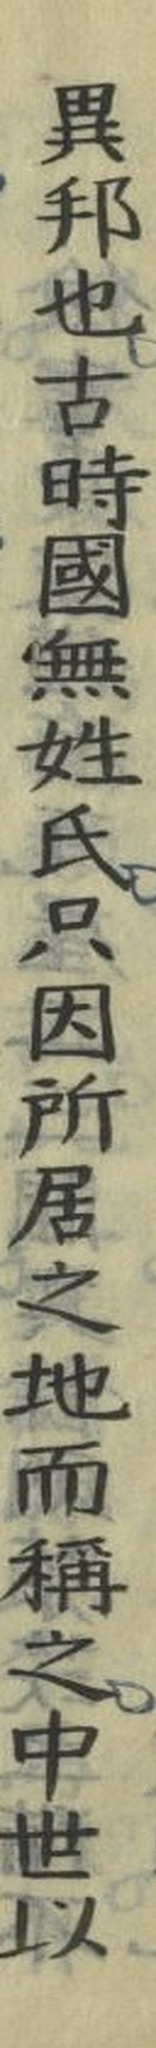異邦也。古時國無姓氏。只因所居之地而稱之。中世以
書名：南島志
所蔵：University of the Ryukyus Library
